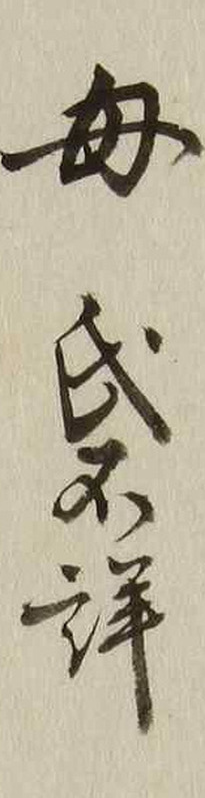母氏不詳
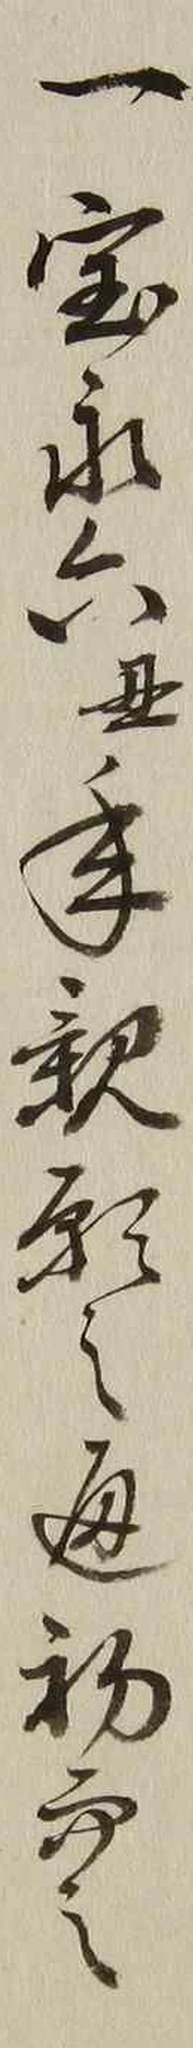一宝永六丑年親願之通初而之
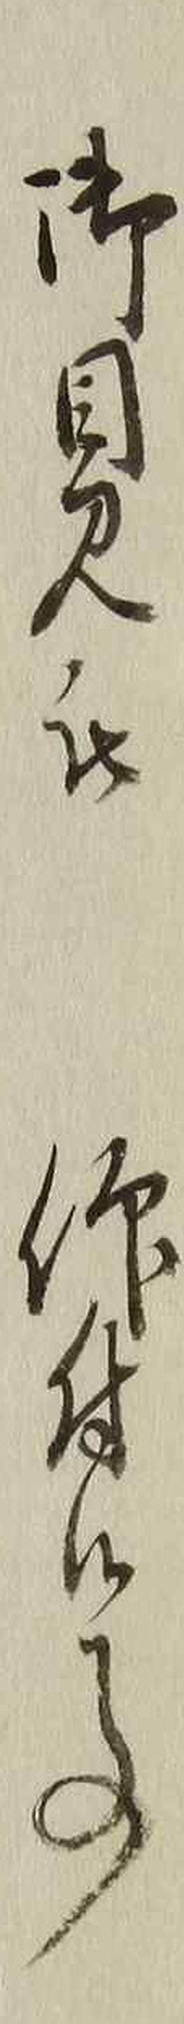御目見被仰付候事
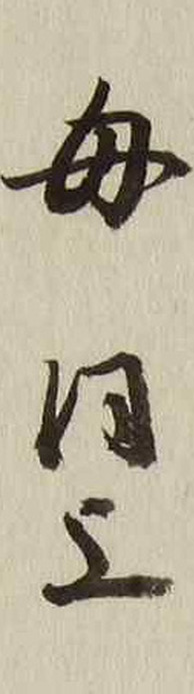母同上
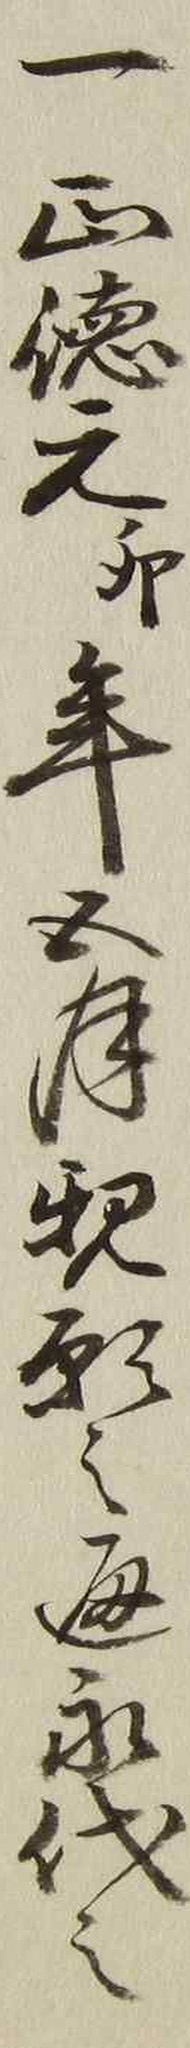一正徳元卯五月親願之通永代之
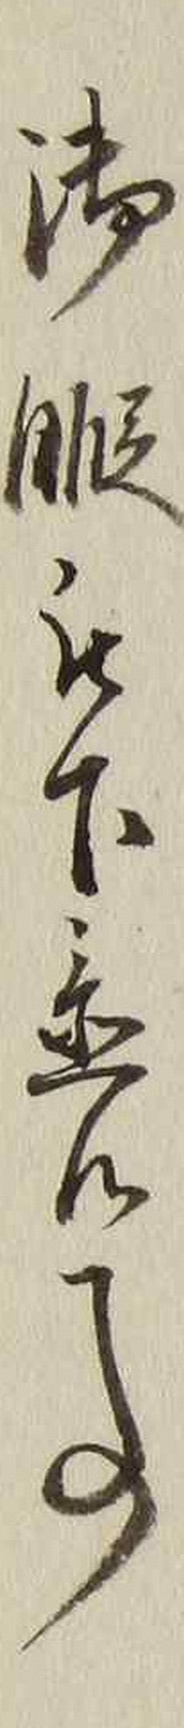御暇被下置候事
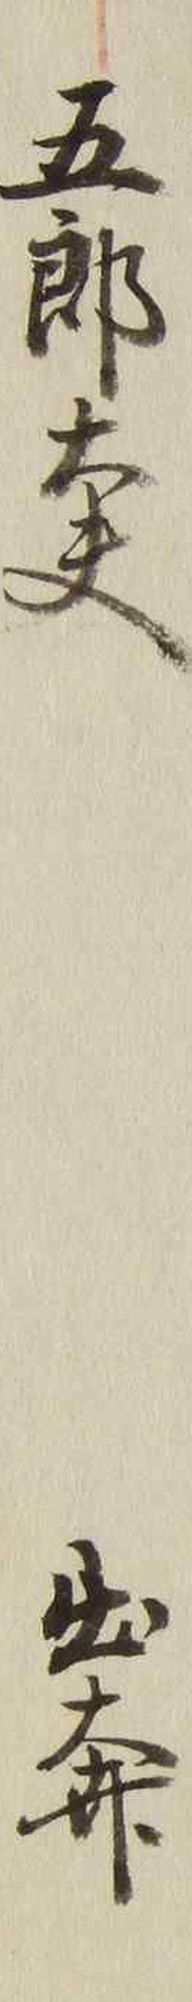五郎大夫出奔

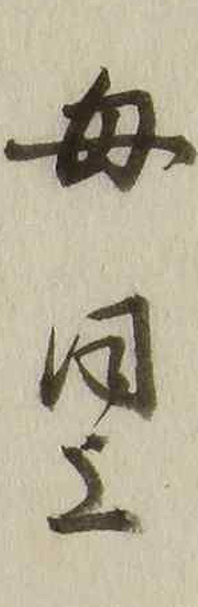母同上
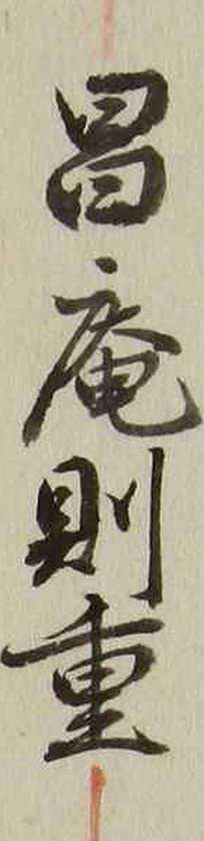昌庵則重
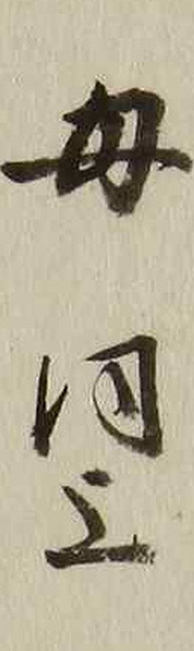母同上
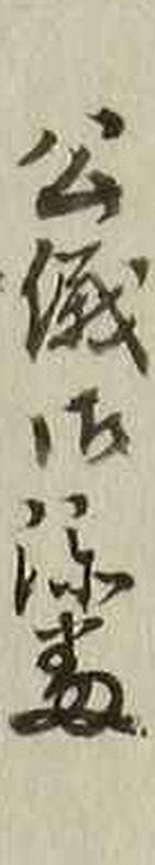公儀御添番
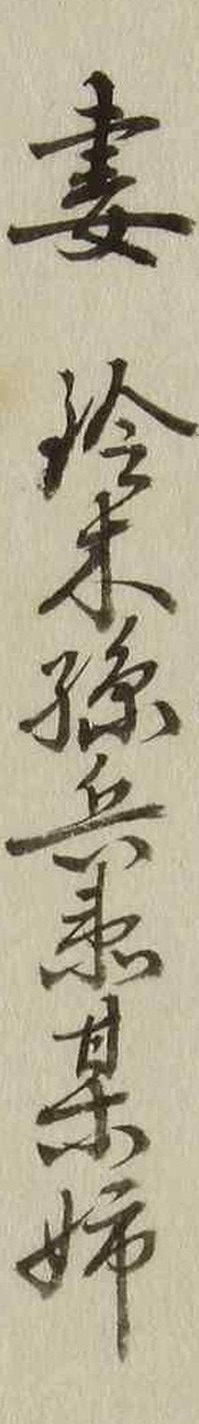妻鈴木孫兵衛某姉
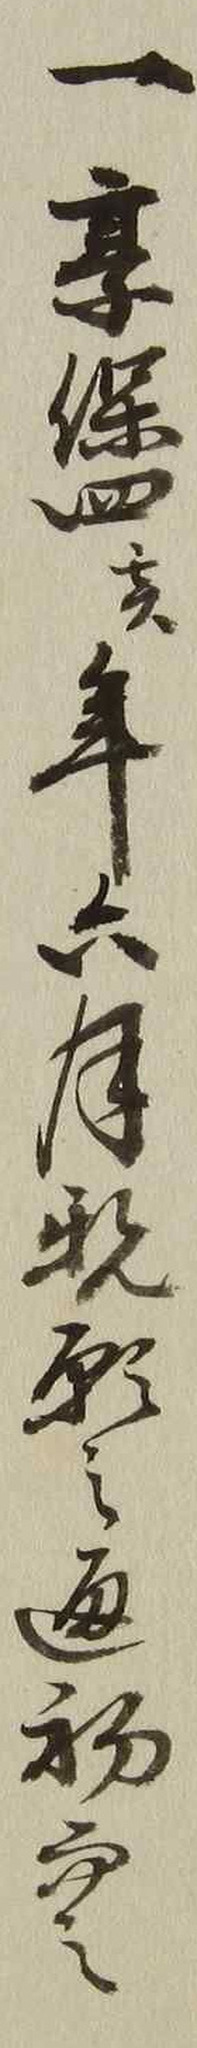一享保四亥年六月親願之通初而之
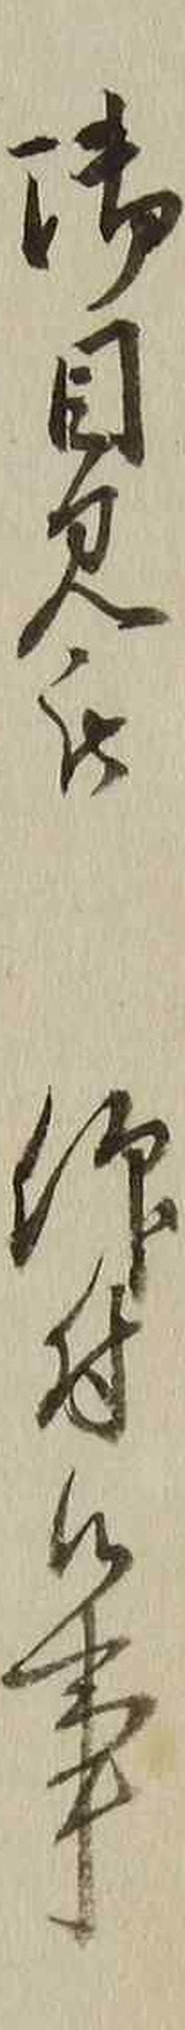御目見被仰付候事
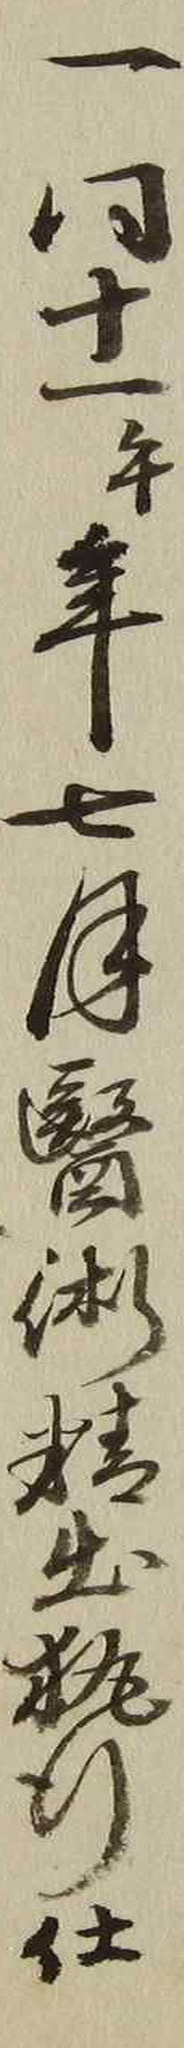一同十一午年七月医術精出執行仕
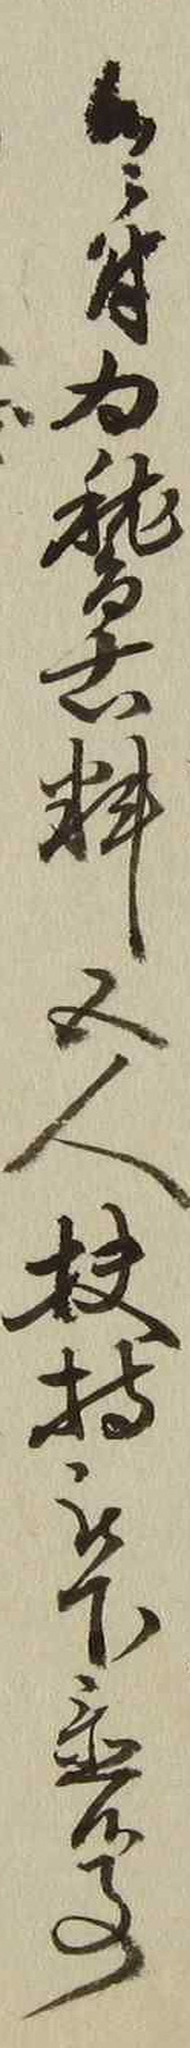候ニ付為稽古料五人扶持被下置候事
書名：諸士系譜　巻之31　い之部31
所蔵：会津若松市立会津図書館
